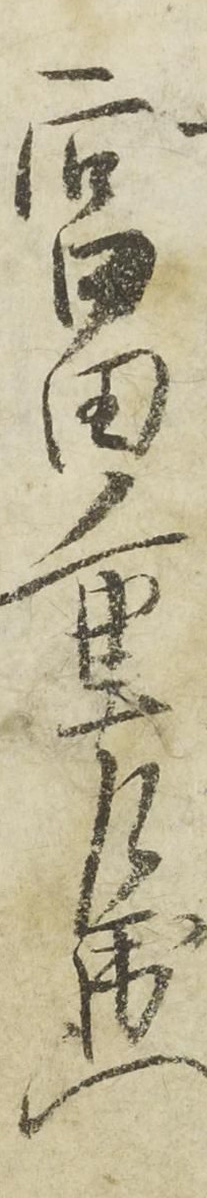宮田重左衛門
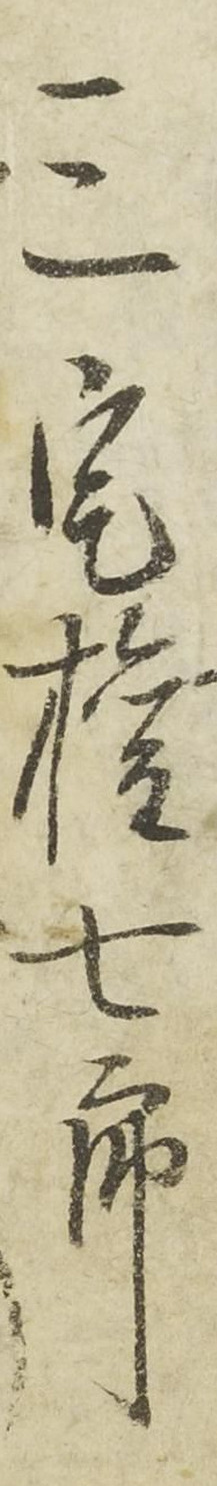三宅権七郎
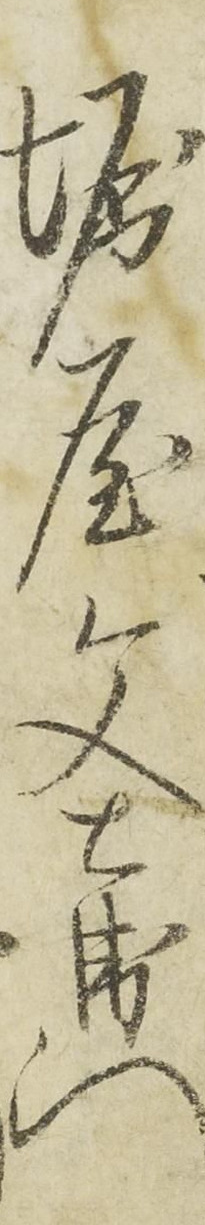堀屋文右衛門
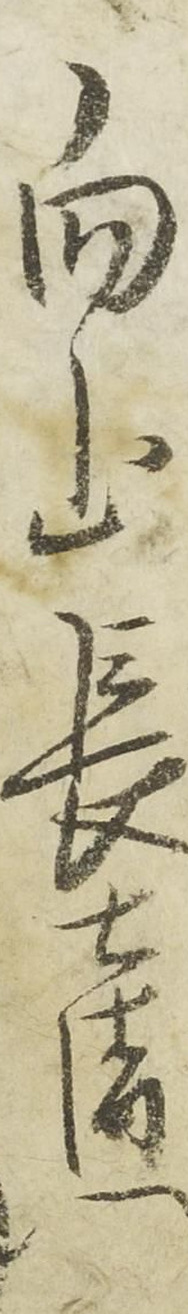向山長七衛門
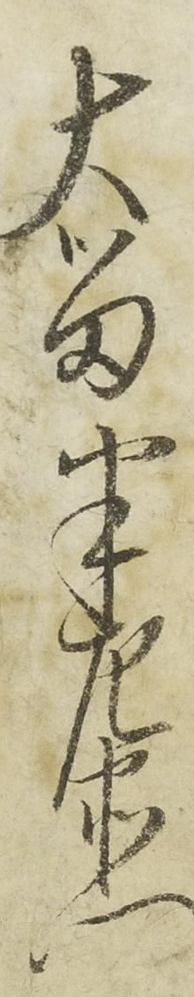大留半左衛門
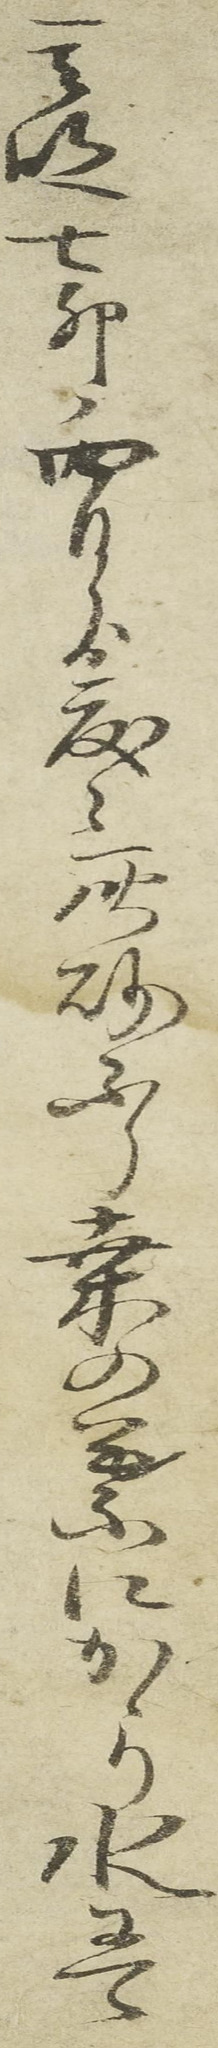一天明七卯ノ四月ゟ度々灰砂ふり桑の葉にかかり水にて
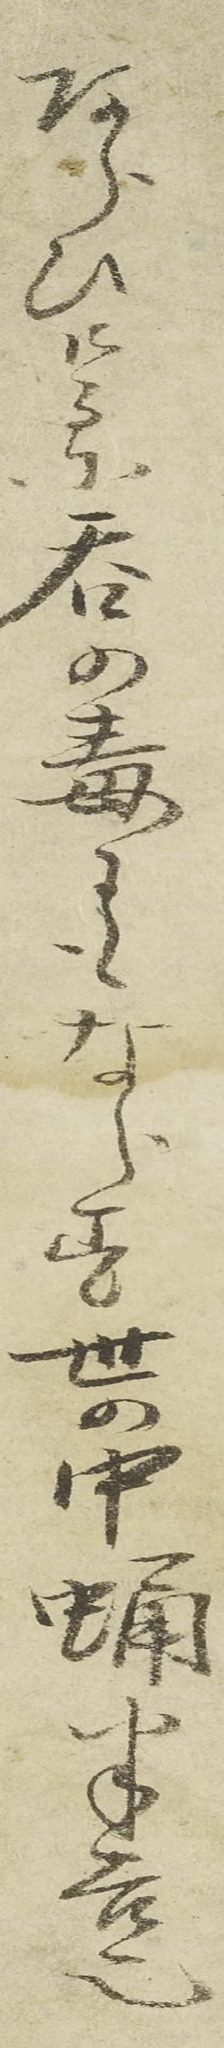あらひけるに蚕の毒にもならす世の中蛹半吉也
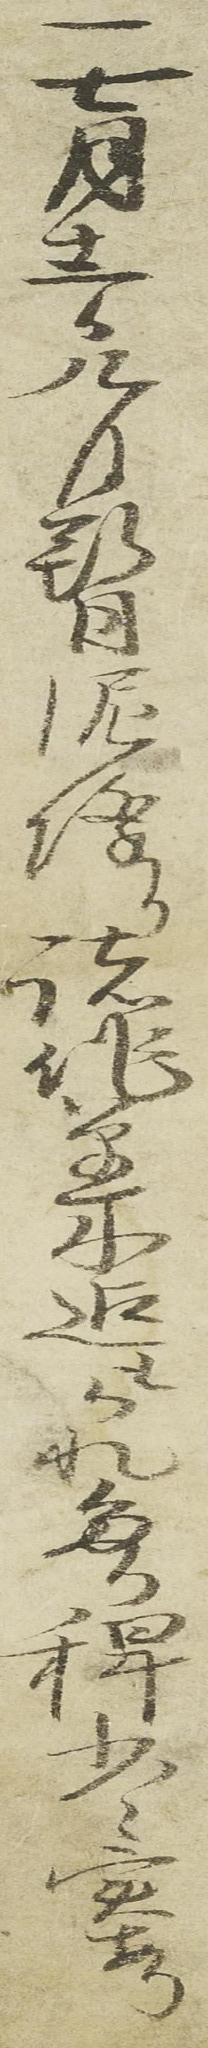一七月十二日八月朔日泥降り諸作草木迄もかれたり稗少々実あり
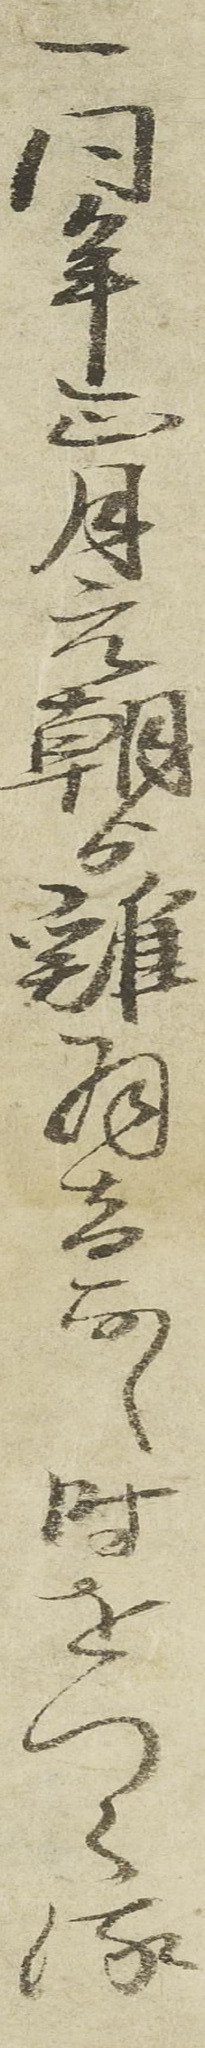一同年正月の朝ゟ鶏羽音なし時をつくる
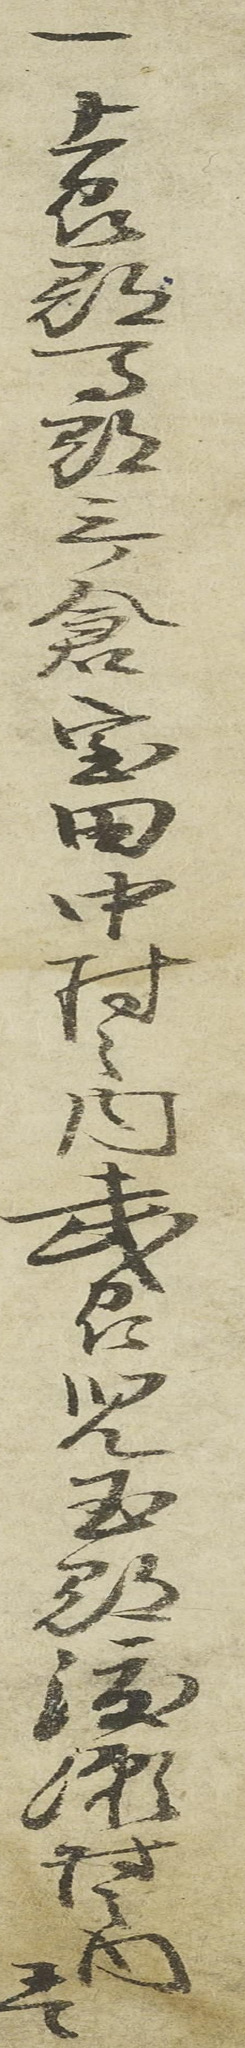一上州郡馬郡三の倉室田中村の内武州児玉郡渡瀬村の内まて
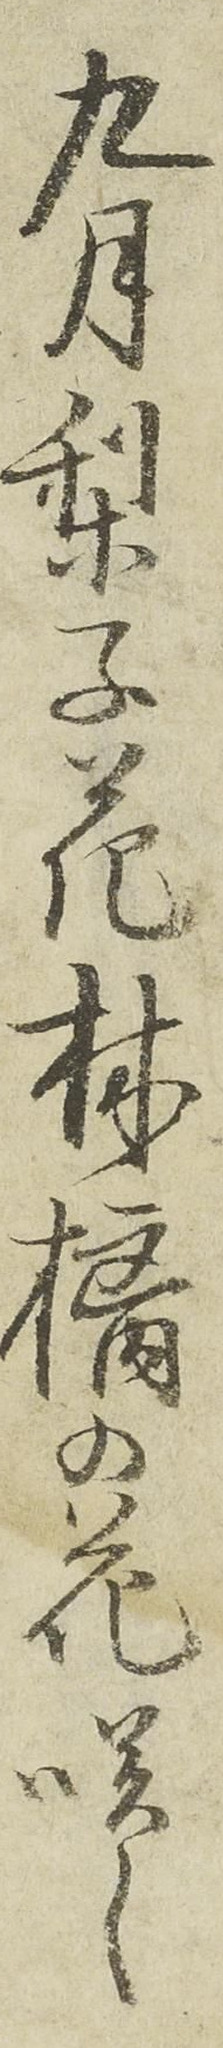九月梨子花林檎の花咲く
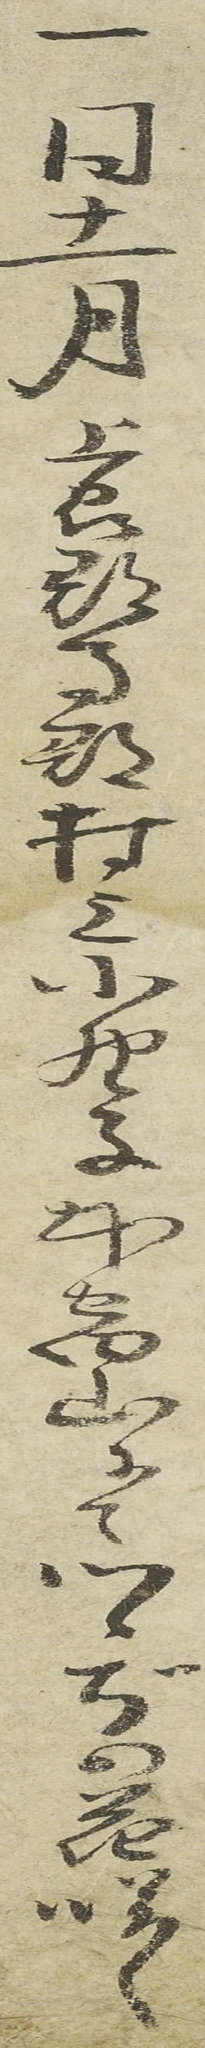一同十一月上州郡馬郡村上小野子本宿山にてツヽジの花咲く
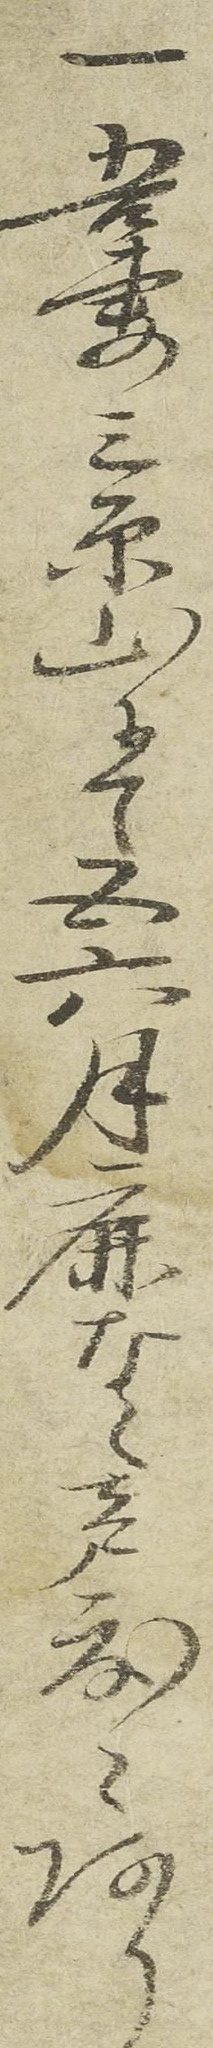一吾妻三原山にて五六月鹿なく声度々あり

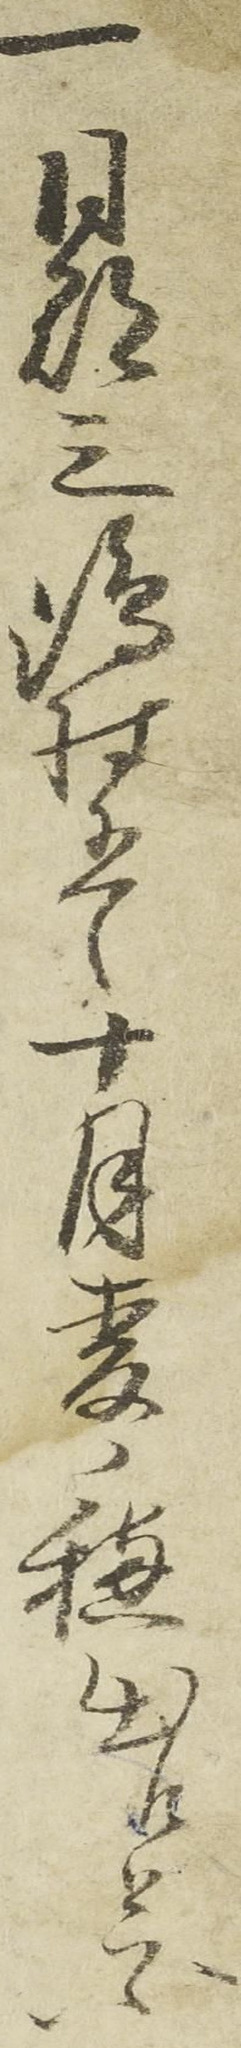一同郡三嶋村にて十月麦ノ穂出ルとて
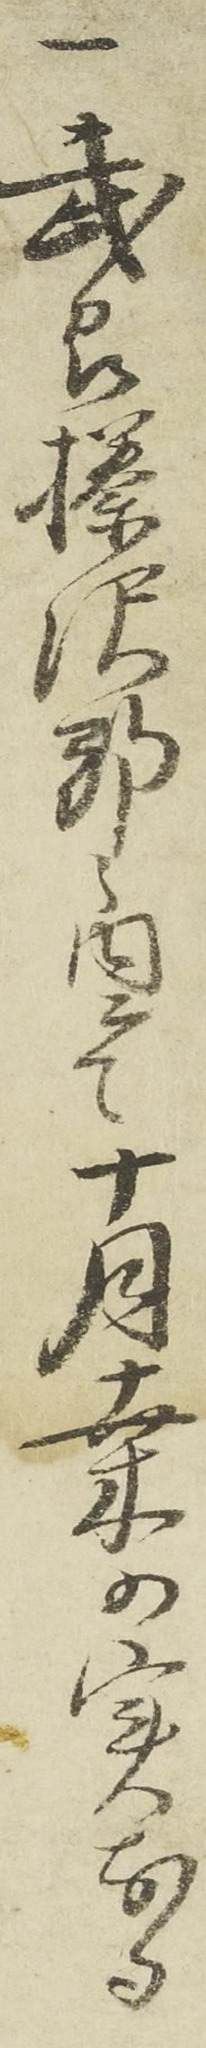一武州榛沢郡の内ニて十月桑の実なる
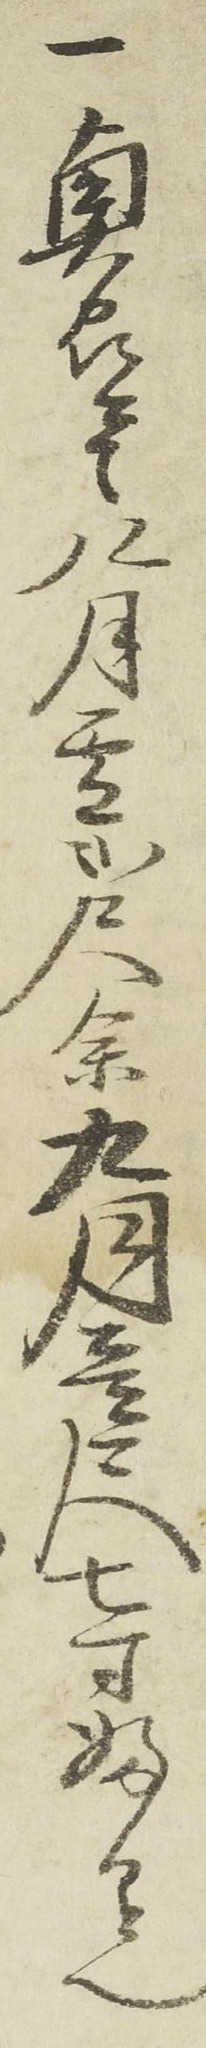一奥州ニて八月雪弐尺余九月壱尺七寸ふる也
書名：浅間大変略記
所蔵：東京大学地震研究所図書室 Earthquake Research Institute Library, The University of Tokyo, JAPAN
